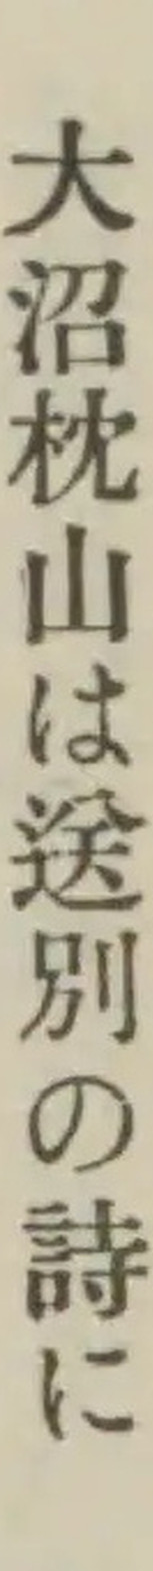大沼枕山は送別の詩に
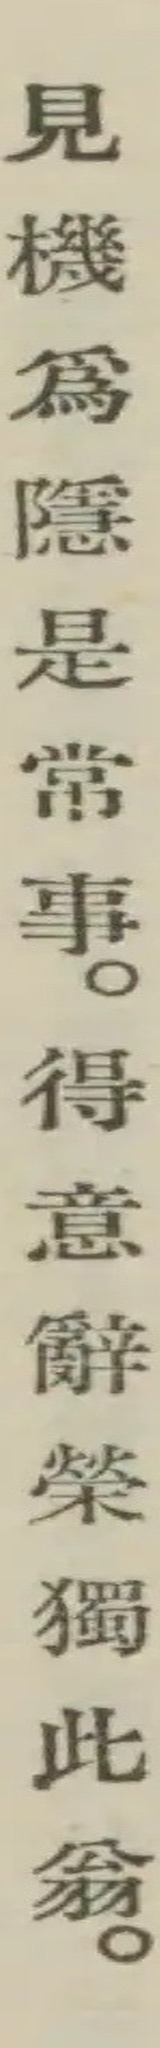見機為隠是常事。得意辭榮獨此翁。
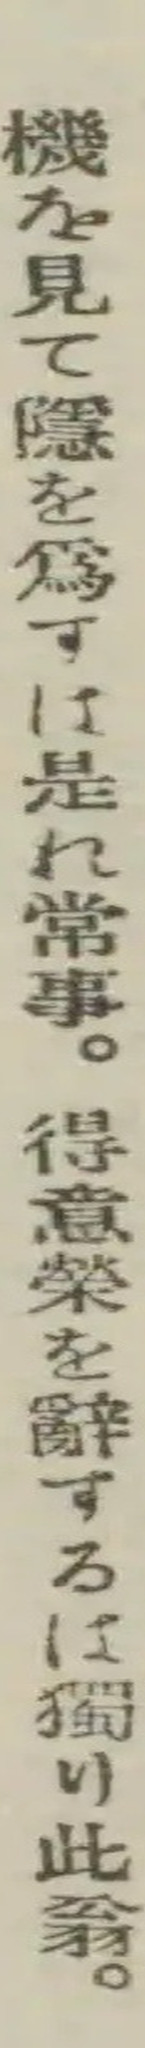機を見て隠を為すは是れ常時。得意栄を辞するは獨り此翁
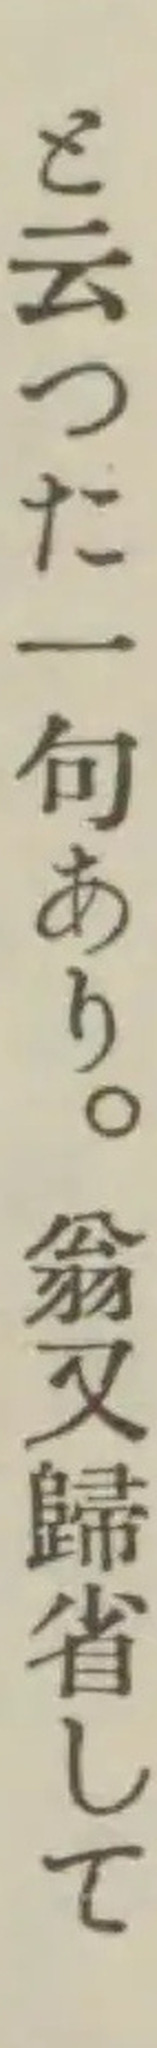と云つた一句あり。翁又帰省して
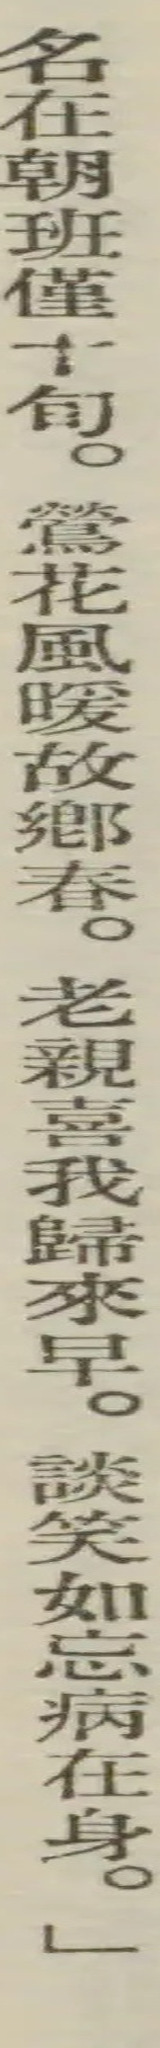名在朝班僅十旬。鶯花風暖故鄕春。老親喜我歸來早。談笑如忘病在身。」
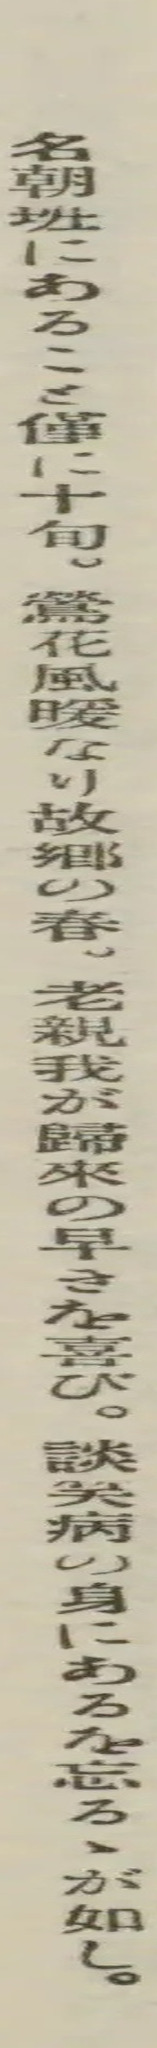名朝班にあること僅に十旬。鶯花風暖なり故鄕の春。老親我が帰来の早さを喜び。談笑病の身にあるを忘るゝが如し。
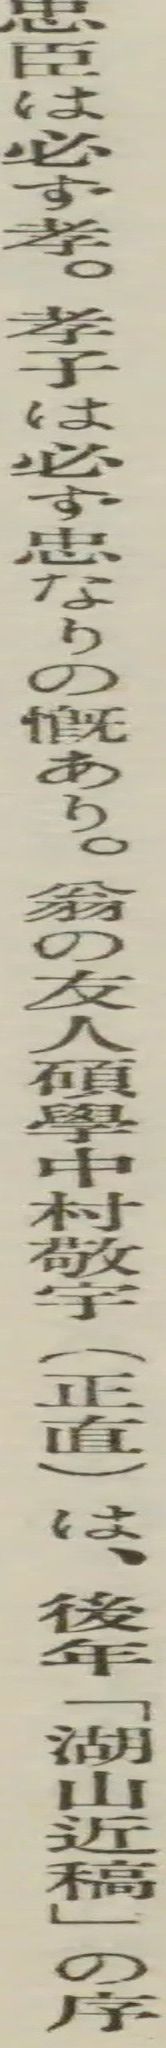忠臣は必ず孝。孝子は必ず忠なりの慨あり。翁の友人碩学中村敬宇(正直)は後年「湖山近稿」の序
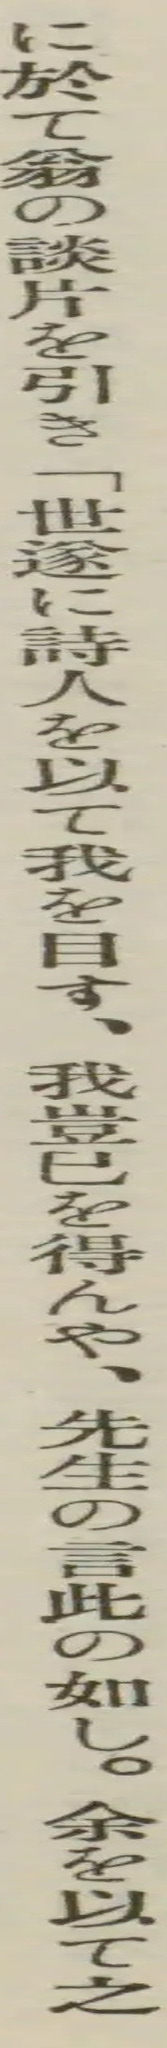に於て翁の談片を引き「世遂に詩人を以て我を目す、我豈巳を得んや、先生の言此の如し。余を以て之
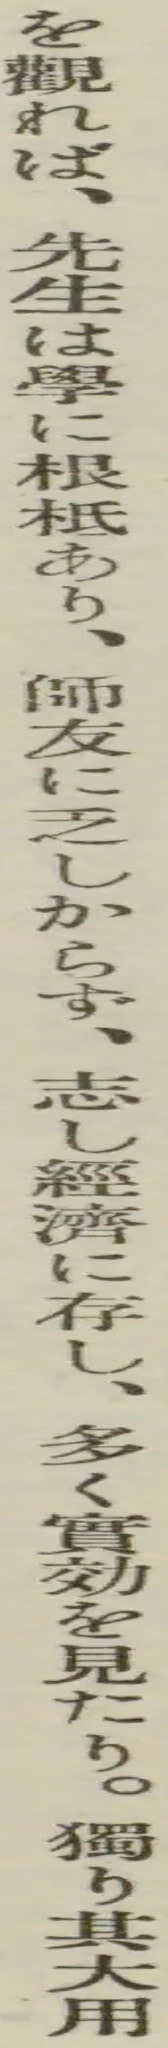を観れば、先生は学に根柢あり、師友に乏しからず、志し経済に存し、多く実効を見たり。獨り其大用
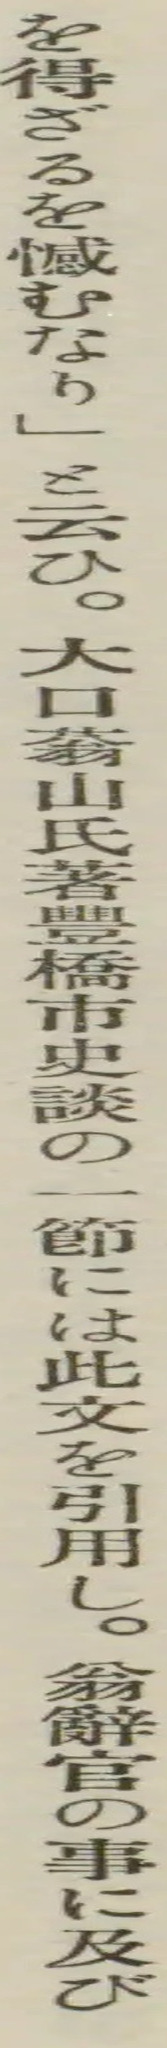を得ざるを憾むなり」と云ひ。大口蓊山氏著豊橋市史談の一節には此文を引用し。翁辞官の事に及び
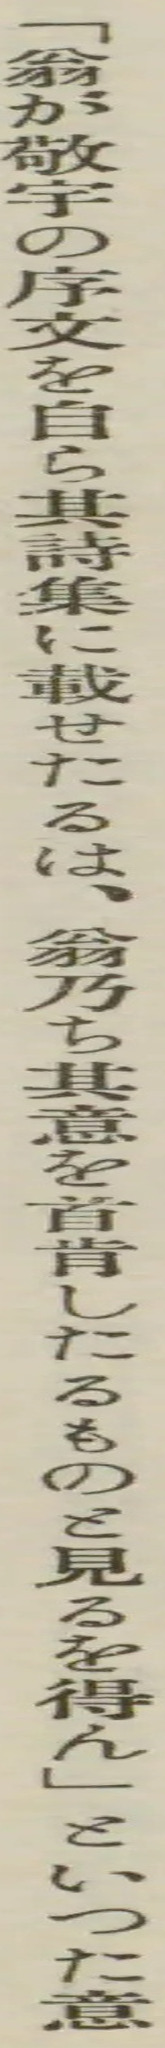「翁が敬宇の序文を自ら其詩集に載せたるは、翁乃ち其意を首肯したるものと見るを得んや、」といつた意
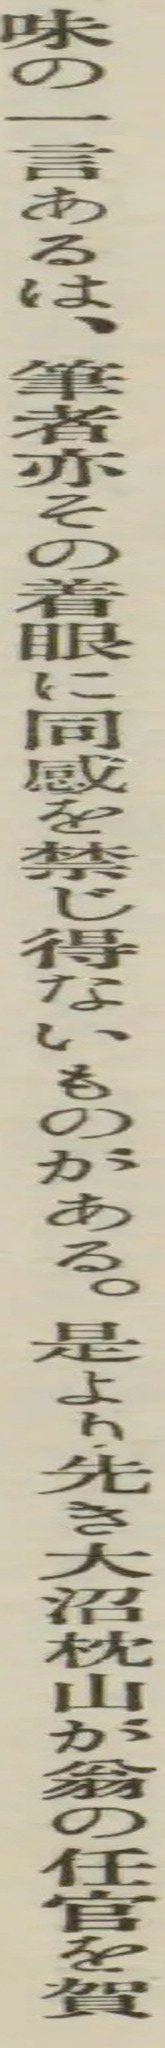味の一言あるは、筆者亦その着眼に同感を禁じ得ないものがある。是より先き大沼枕山が翁の任官を賀
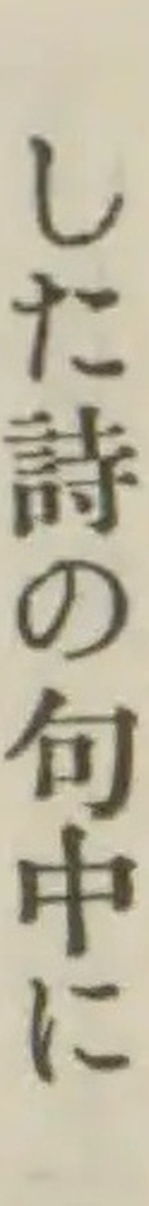した詩の句中に
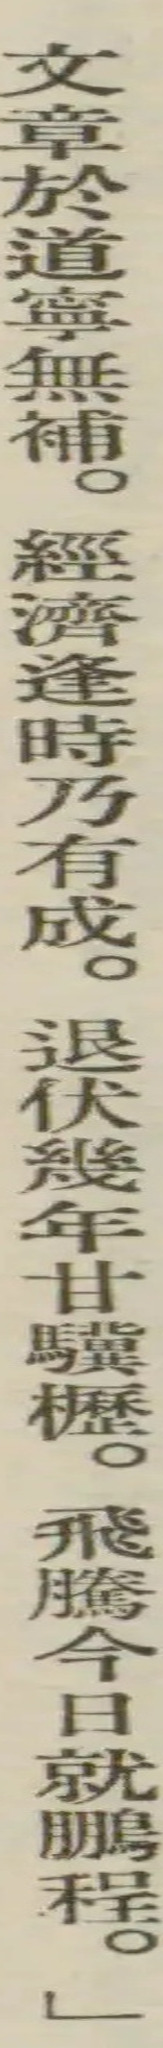文章於道寧無補。經濟逢時乃有成。退伏幾年甘驥櫪。飛騰今日就鵬程。」
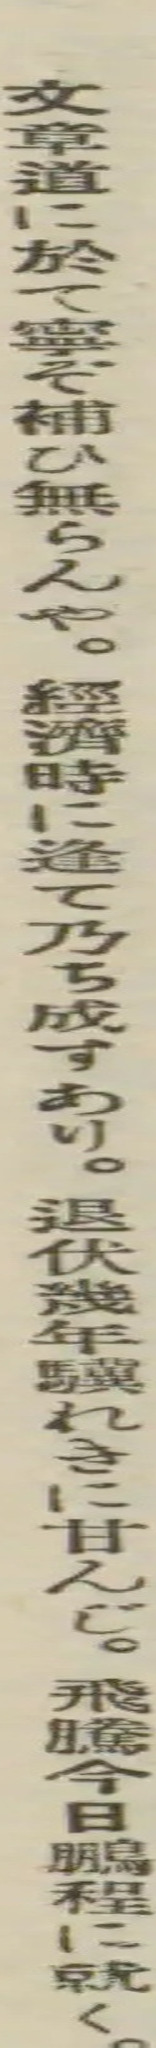文章道に於て寧ぞ補ひ無らんや。経済時に逢て乃ち成すあり。退伏幾年驥れきに甘んじ。。飛騰今日鵬程に就く。

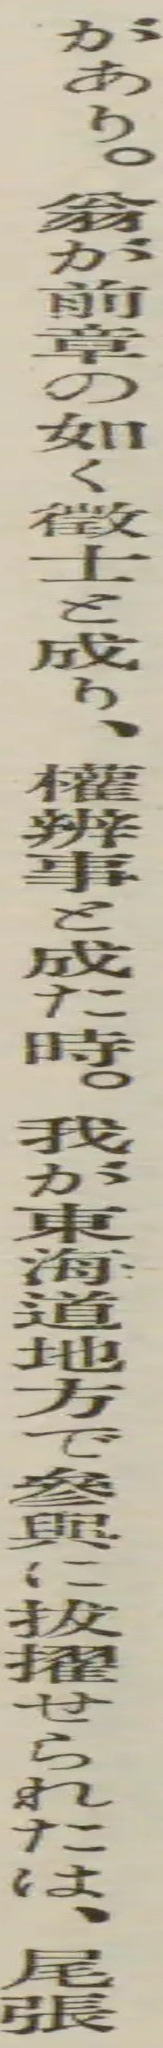があり。翁が前章の如く徴士と成り、権辨事と成た時。我が東海地方で参与に抜擢せられたは、尾張
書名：小野湖山翁小伝
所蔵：国立国会図書館 National Diet Library, JAPAN
